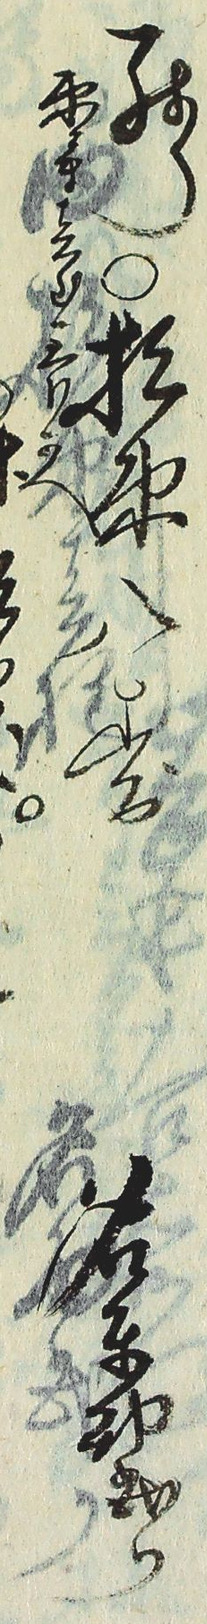残り拾束八歩名東郡当り
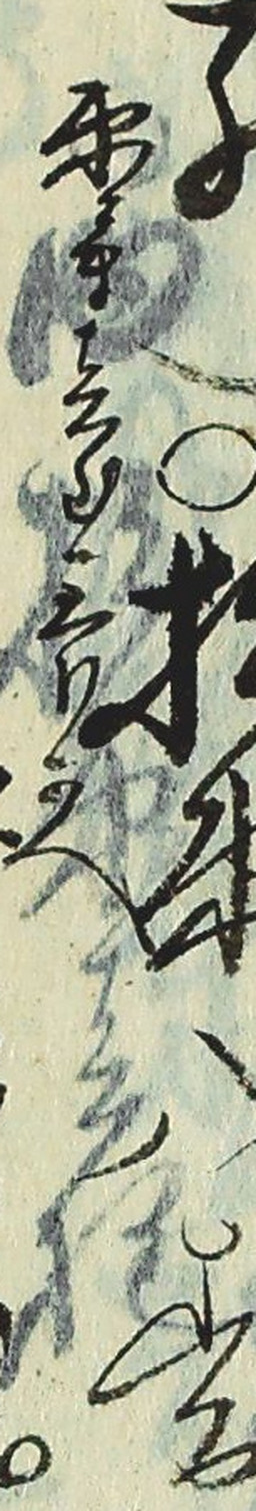束に付壱匁三分かへ
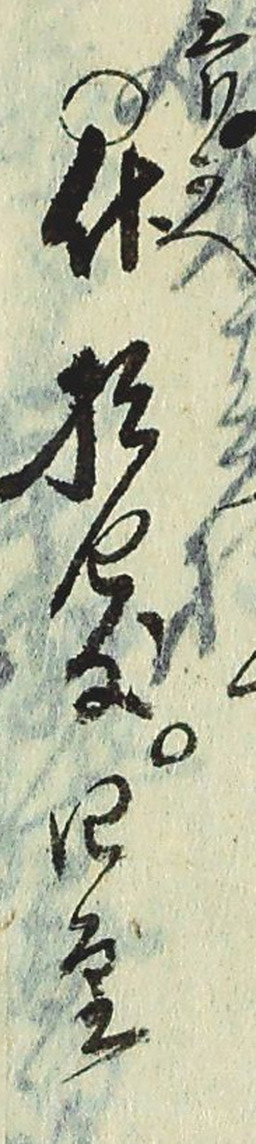代拾四匁〇四厘
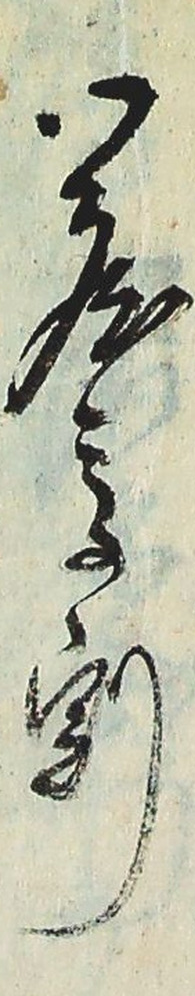御蔵高割
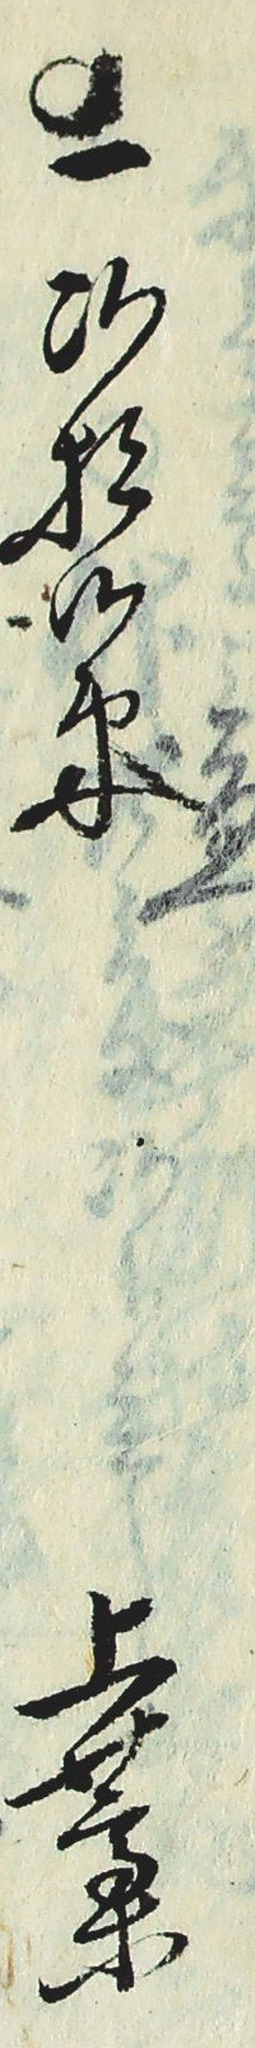一弐拾弐束上藁
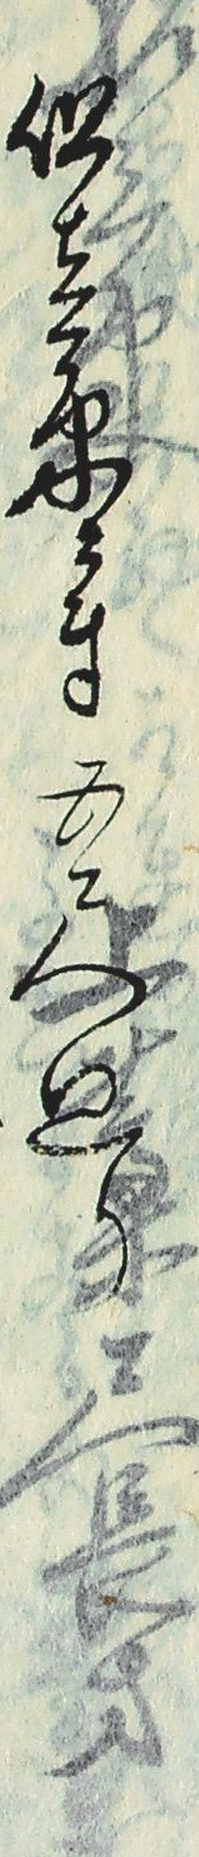但壱束に付五尺廻り
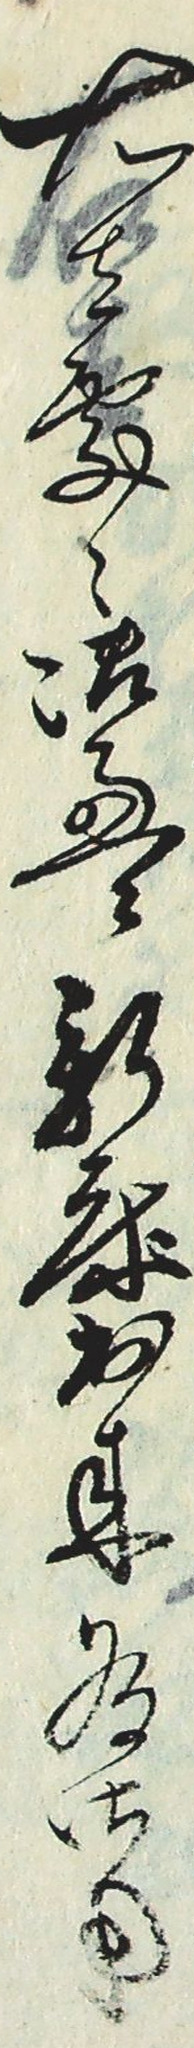右は処々御畳新床出来為御用

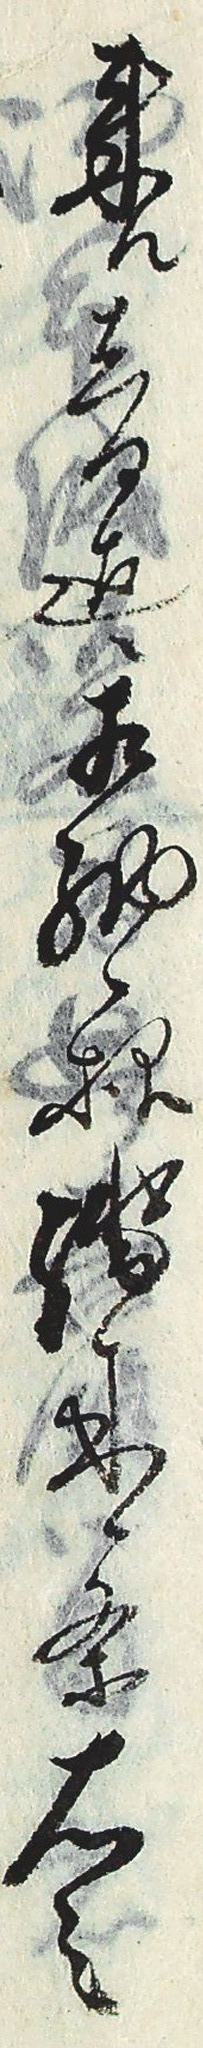来る十二日迄に相納候様誂来候条右之
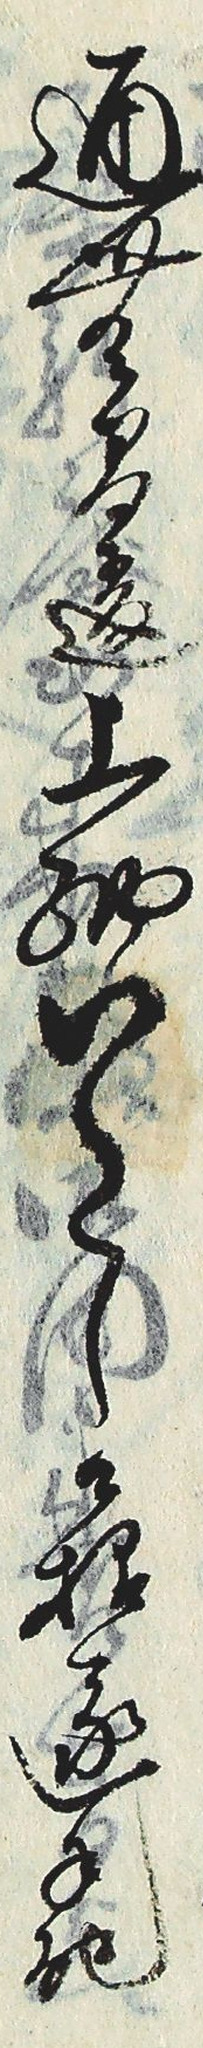通無間違上納いたし候様遂手配
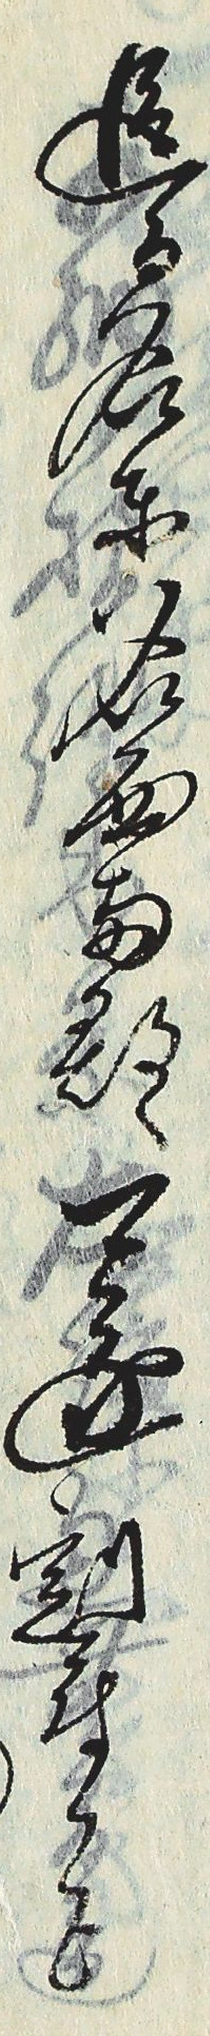追て名東名西両郡へ可遂割苻候以上
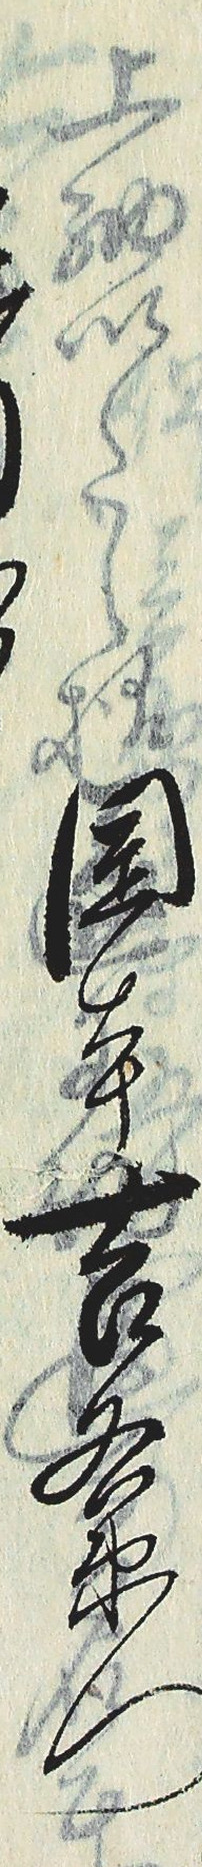岡本吉右衛門
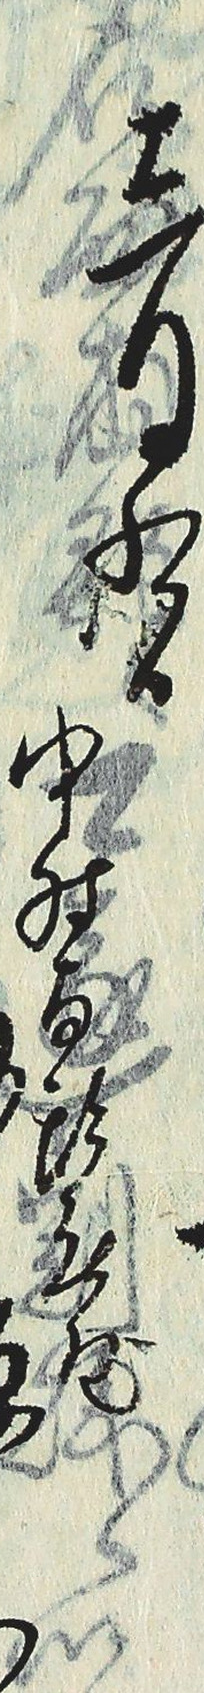十二月九日中村与頭庄屋
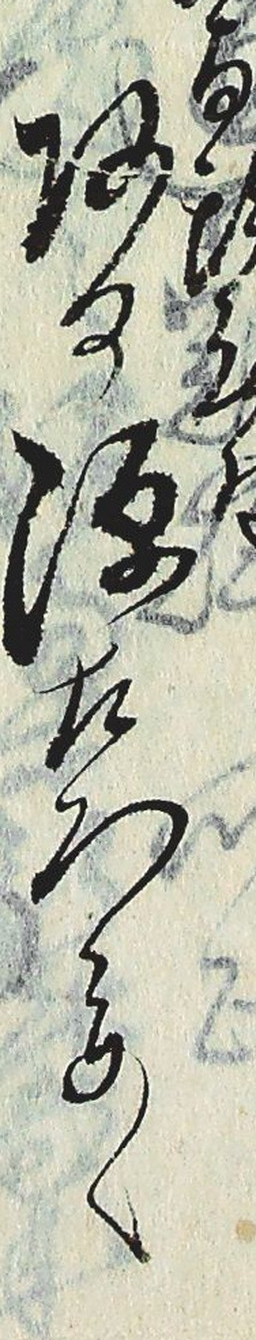阿部源左衛門方へ
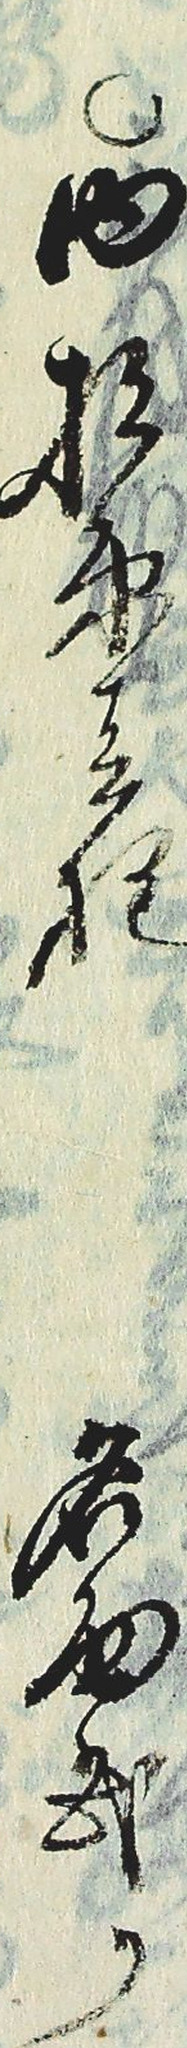内拾束壱把名西当り
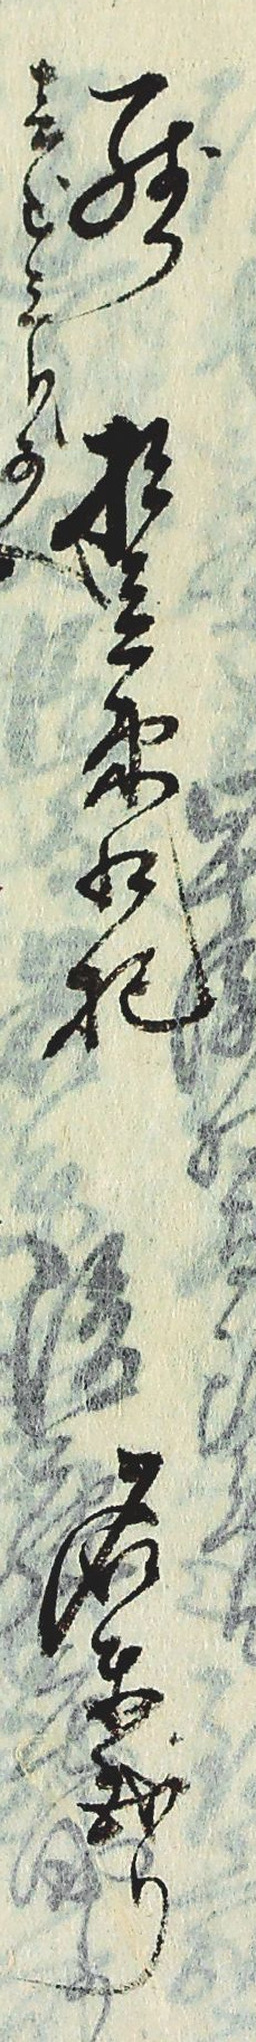残り拾壱束九把名東当り
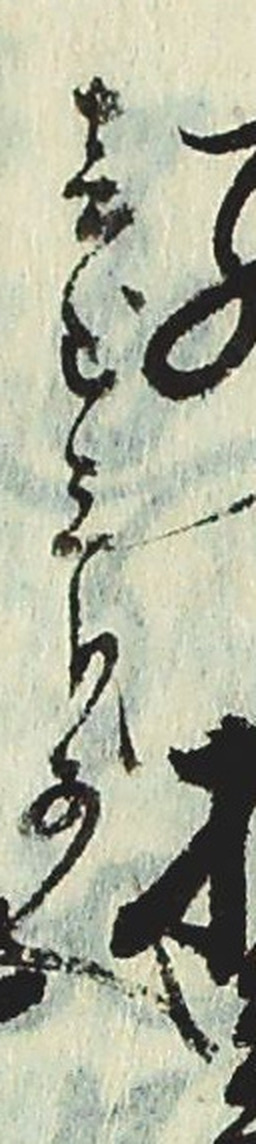壱匁三分かへ
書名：名東郡中諸割賦元帳
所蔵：鳴門教育大学 Naruto University of Education
